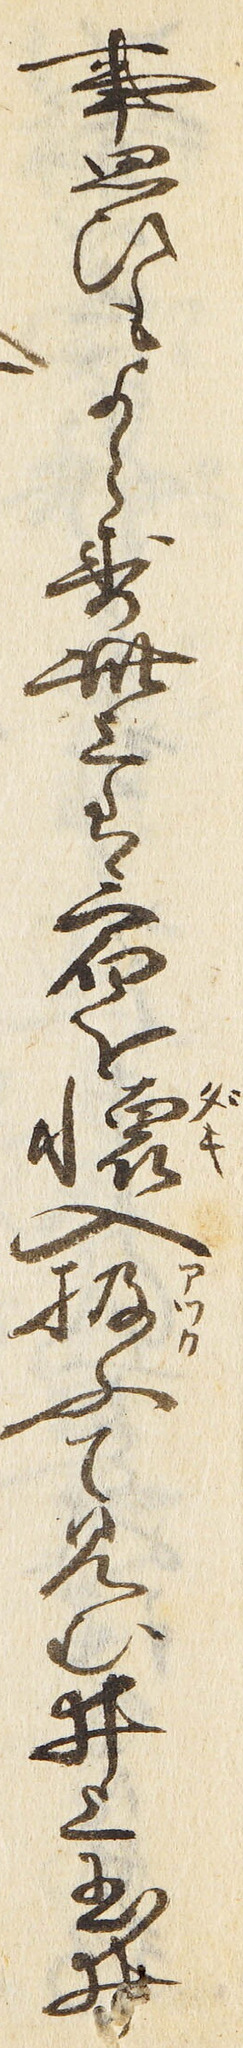事思ひもよらす此上は宿を懐入扱ふて見む井上玉井
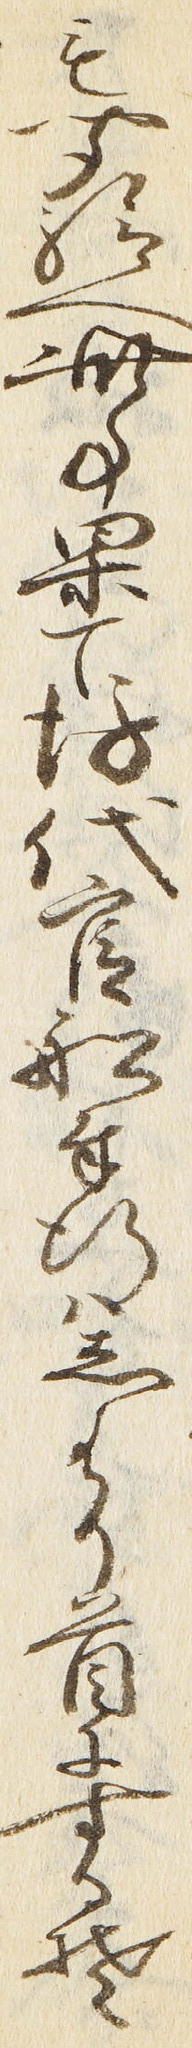も聞給へ此事果て後代官船奉行はしはり首にするそ
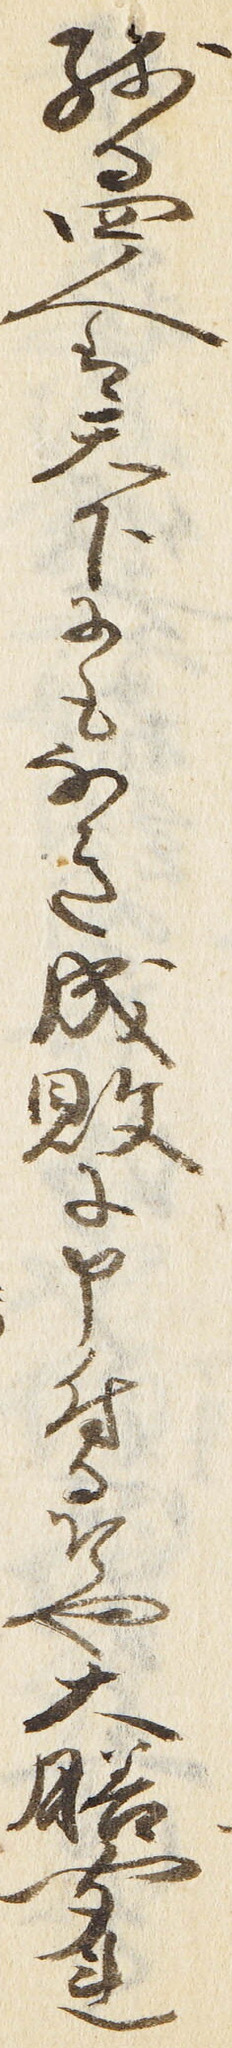残る四人は天下にもなき成敗に申付るそや大膳聞れ
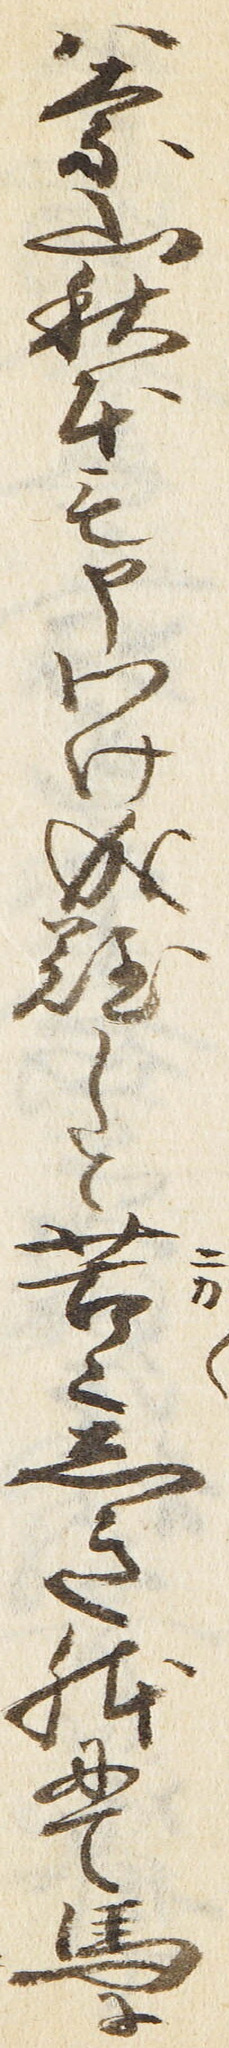は奈山秋本も申わけ成難しと苦々しき体にて馬に
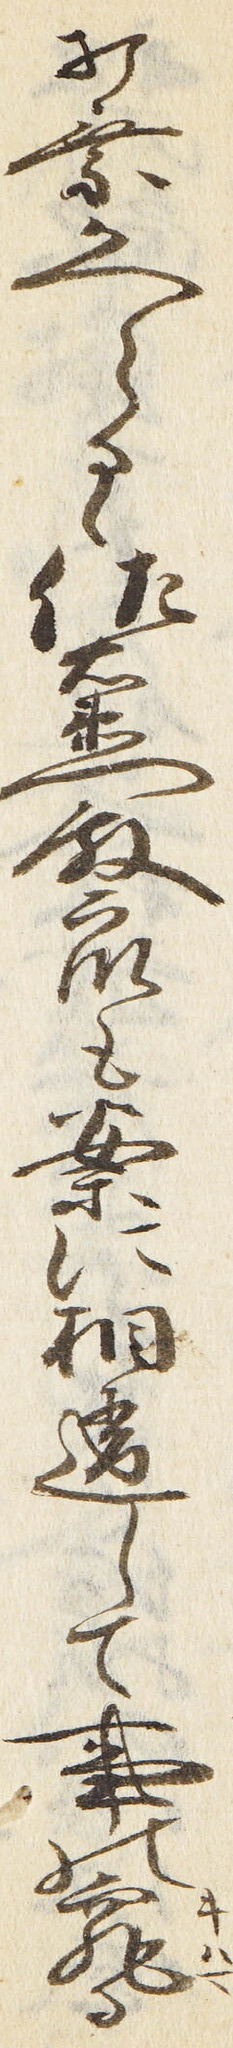打乗かへらるゝ佐左衛門殿衆も案に相違して事の究る
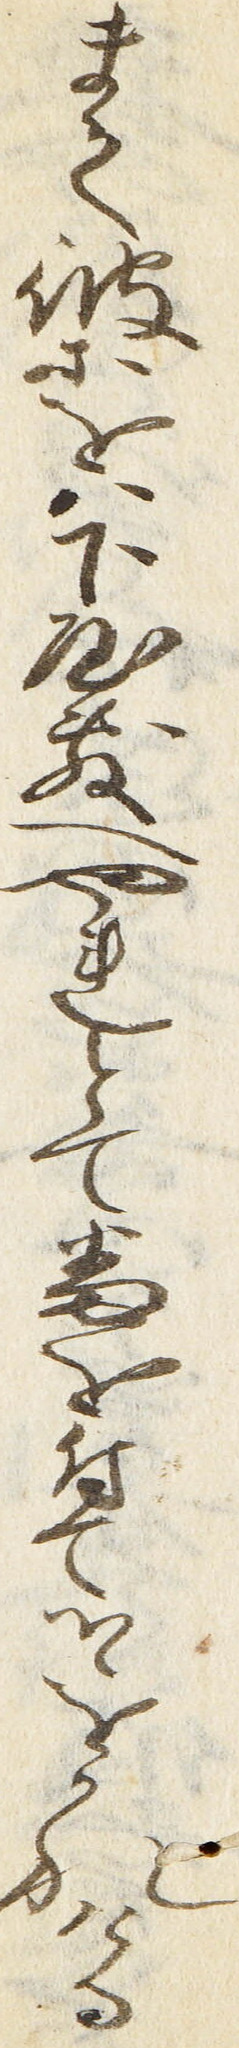まて彼等をは下屋敷へやれとて番を付てそをかれける
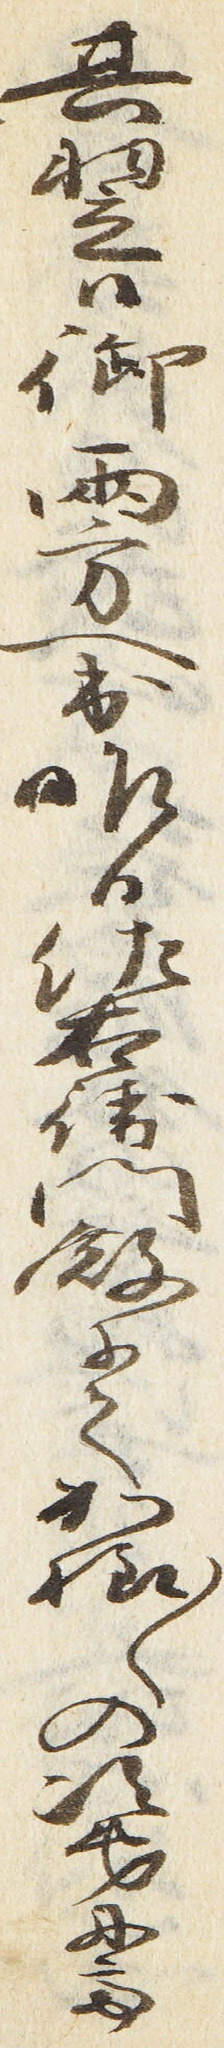其翌日御両方へ出昨日佐右衛門殿にてか様〳〵の次第にて
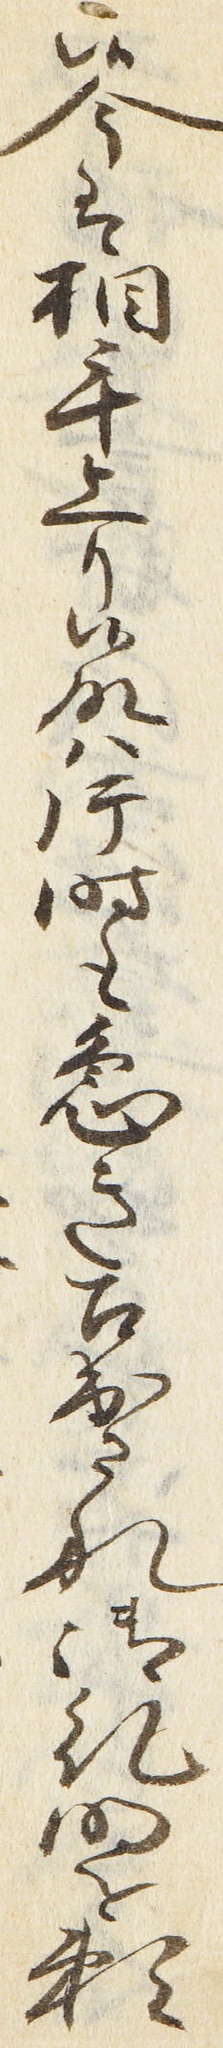候今は相手上り候故は片時も急き召出され御糺明を頼
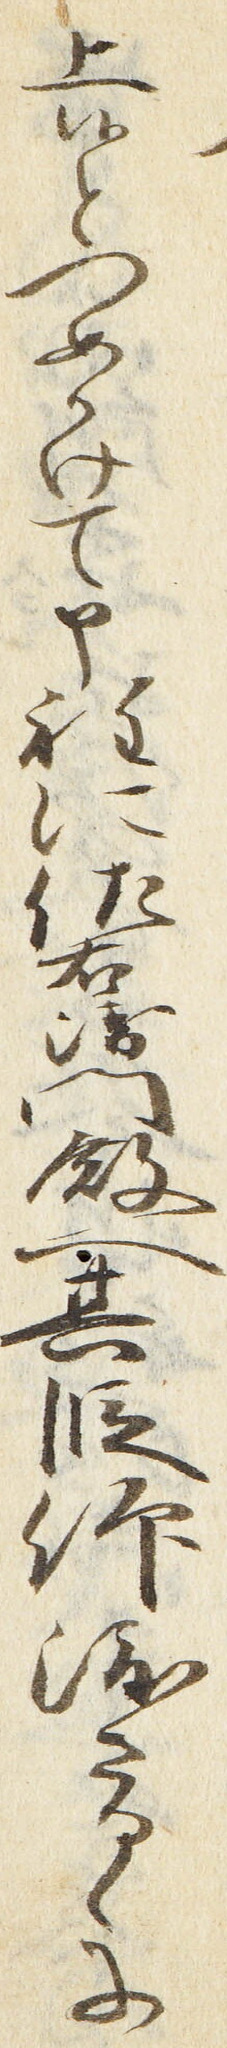上候とつめかけて申程に佐右衛門殿へ其段仰渡さるゝに

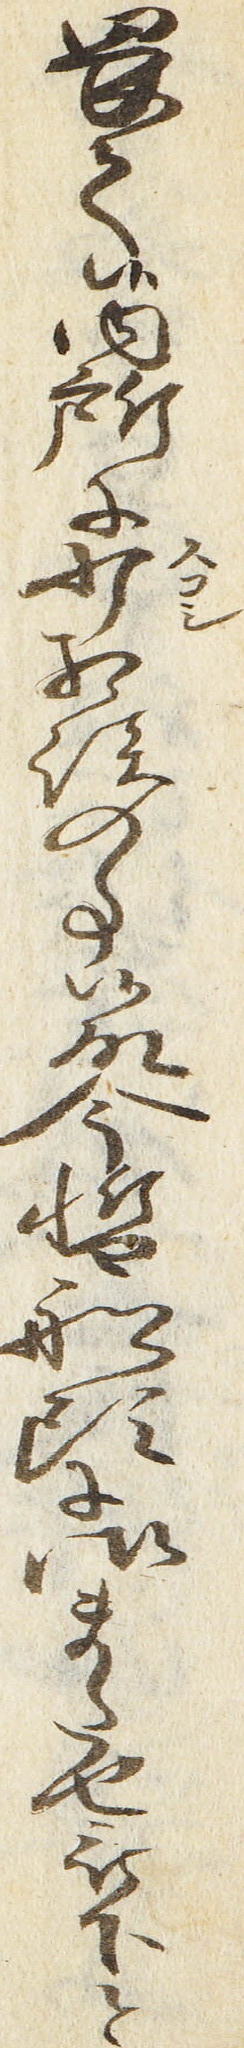畏て候内所に少相談の事候故今暫船頭に御またせ被下と
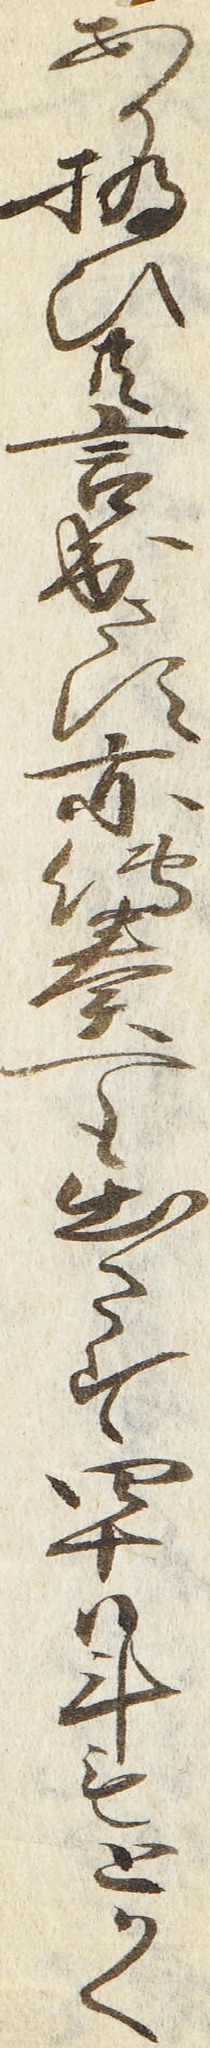あり扱ひ共言出さす亦伝奏へも出さす四十日斗もとかく
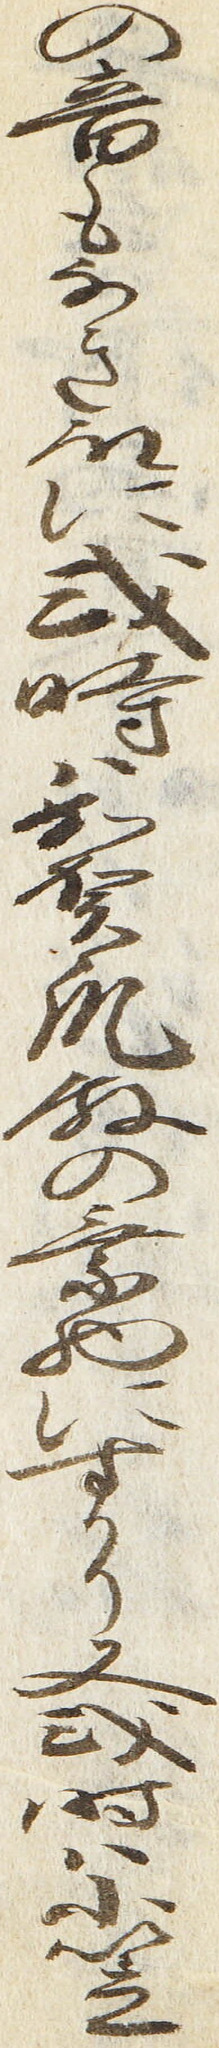の音もなき故に或時は加賀爪殿の乗物にすかり又或時は小笠
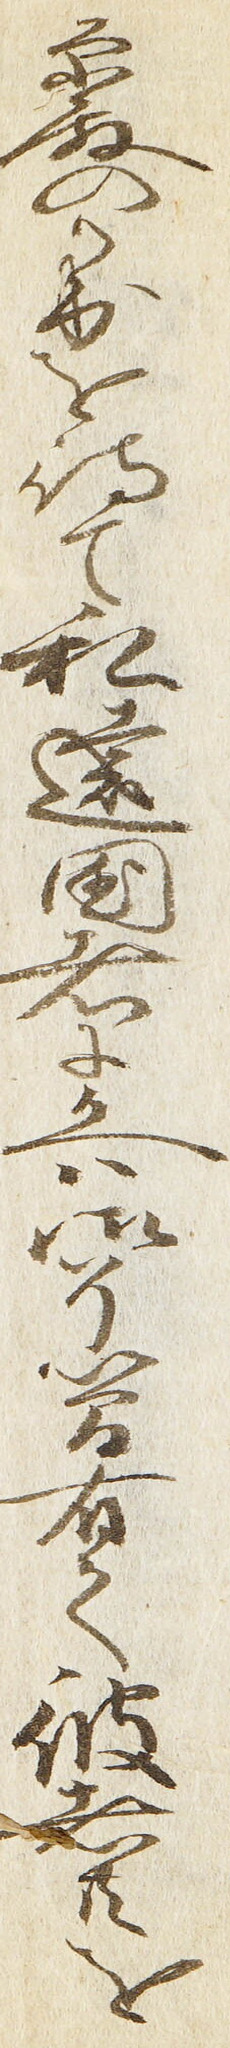原殿の御出を待て私遠国者に候へは御了簡有て彼者共を
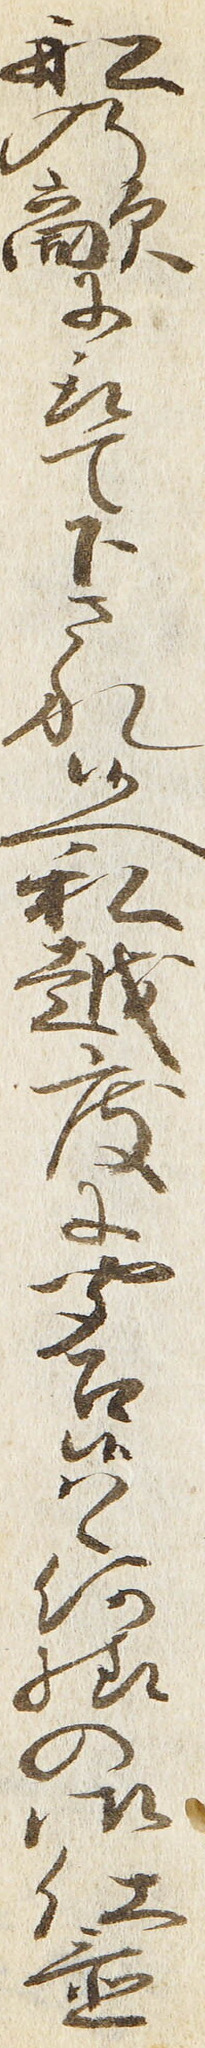船の敵に取て下され候へ私越度に聞召候はゝ何様の御仕置
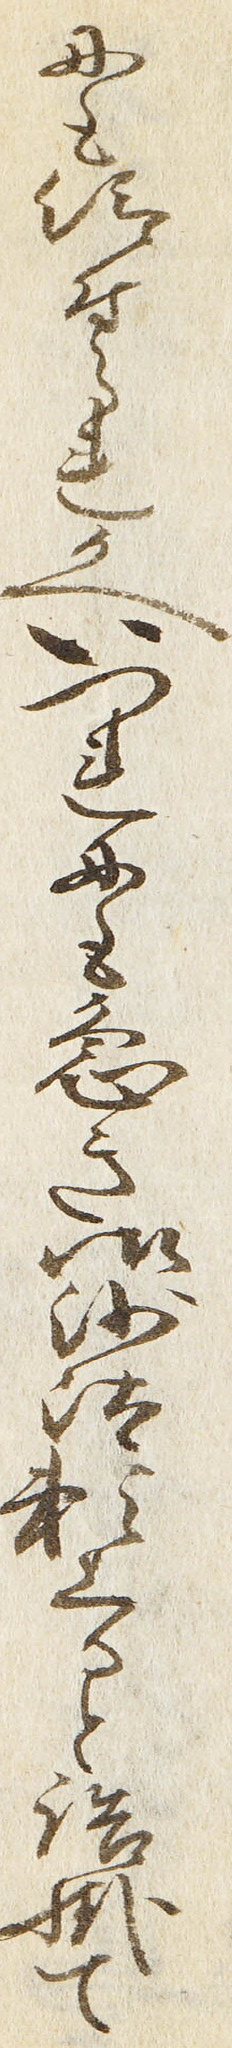にも仰付らえ候へいつれにも急き御沙汰頼上ると詰掛て
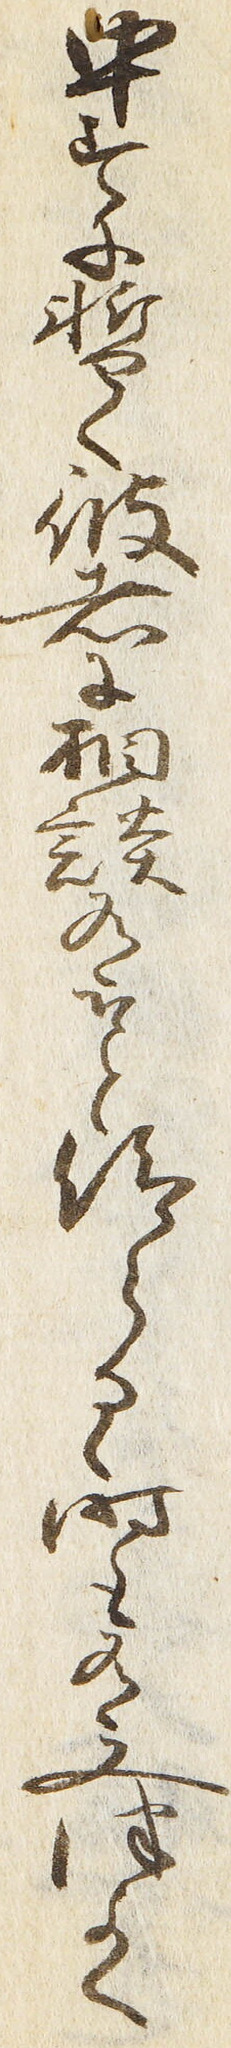申すに暫く彼者共に相談有そと仰らるゝ時も有又つよく
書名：海陸世話日記
